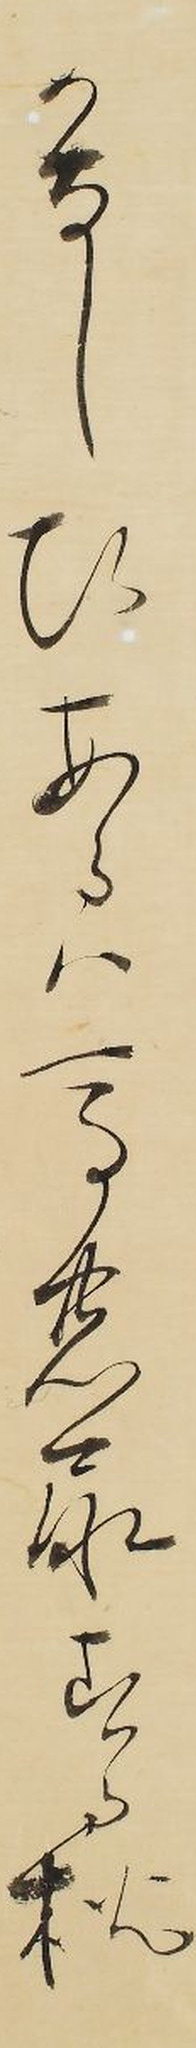かなしひあるは馬の尿する枕
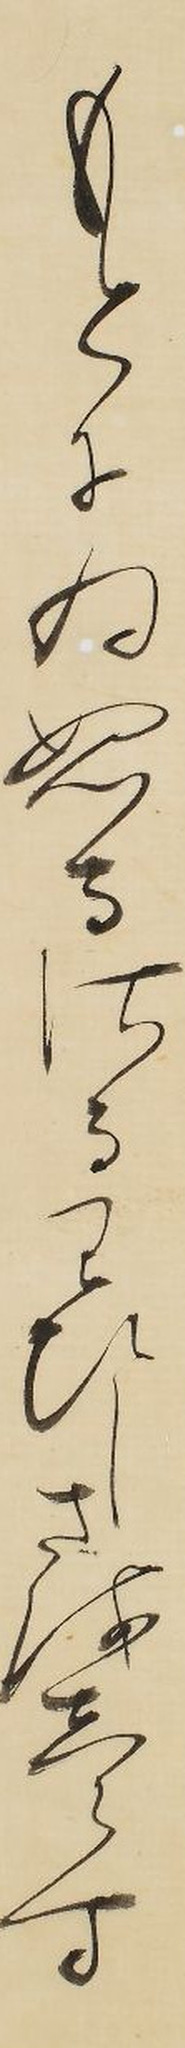もとにいぬるさるわひしさをしらす
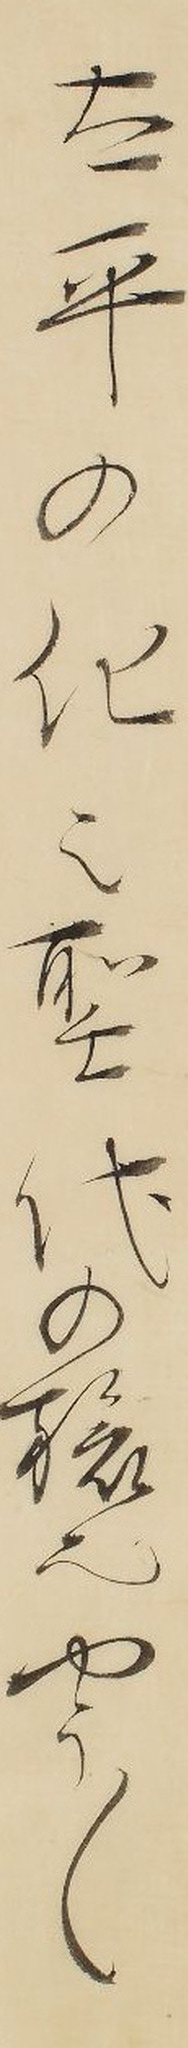太平の他の聖代の旅也やう〳〵
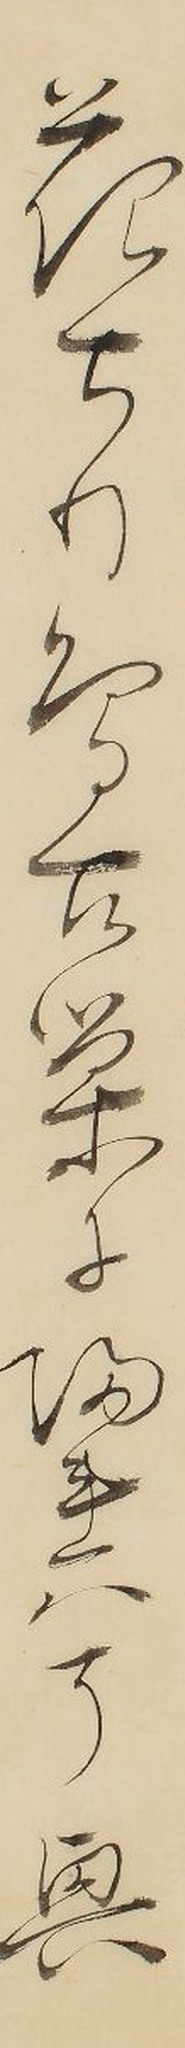花ちり鳥古巣に帰れはそ興
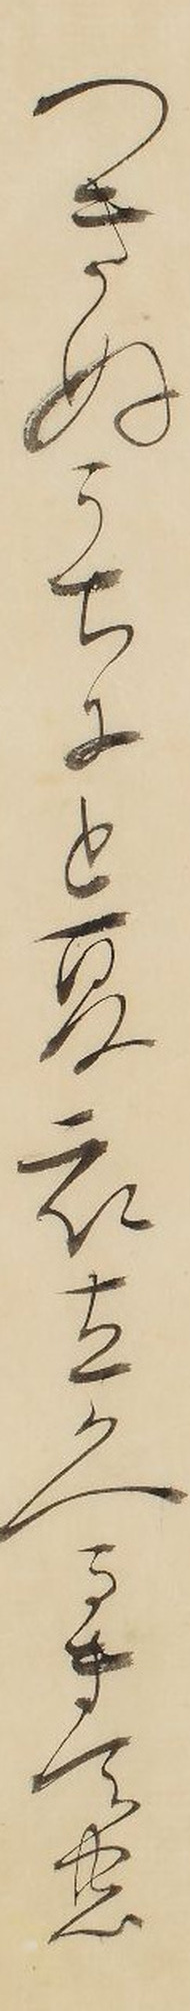つきぬうちにと夏衣立かへるまての
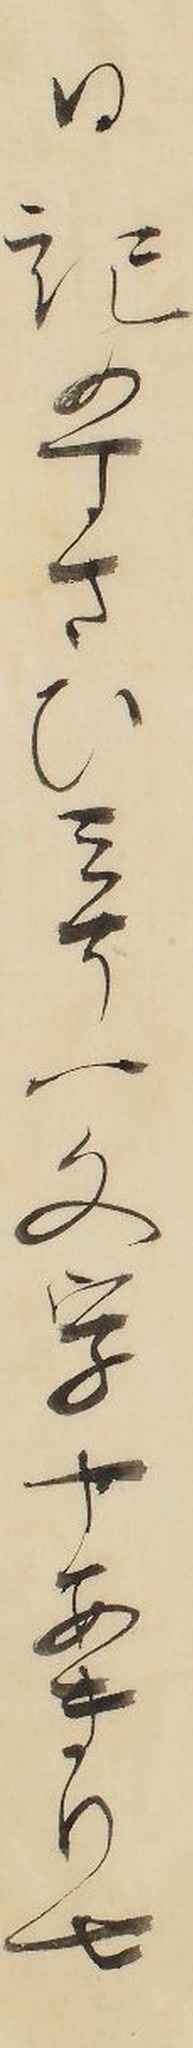日記のすさひみそ一文字十あまり七
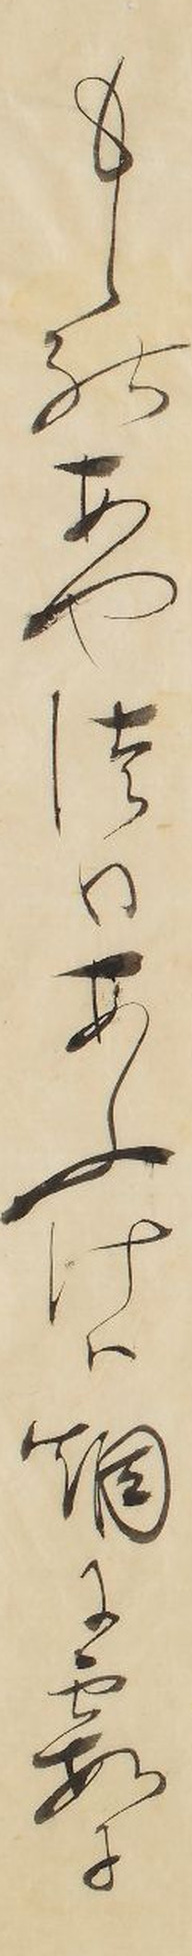もしのあやつりあふけは烟に霞に
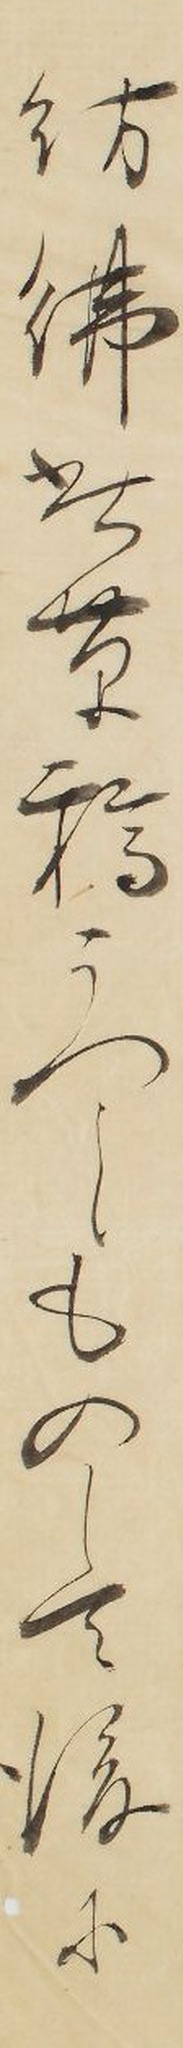彷彿此草稿うつしものして後に

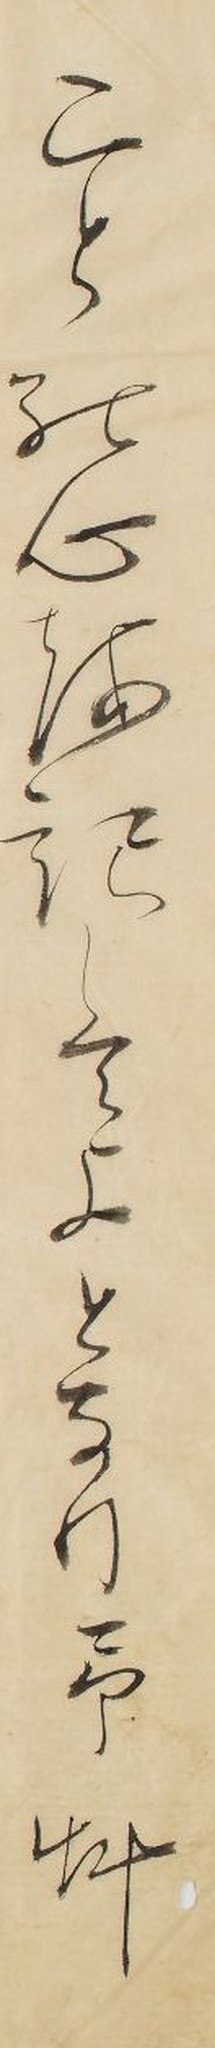ことの心を記してよとなり予艸
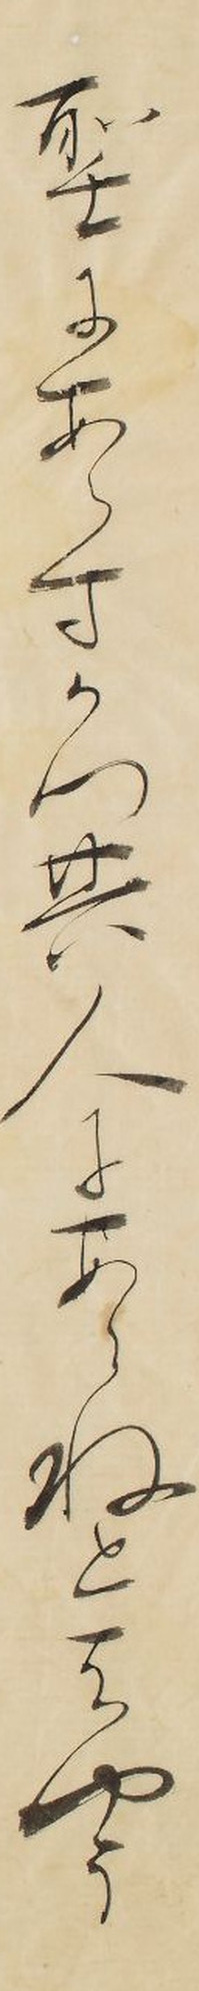聖にあらすかつ共人にあらねとはやう
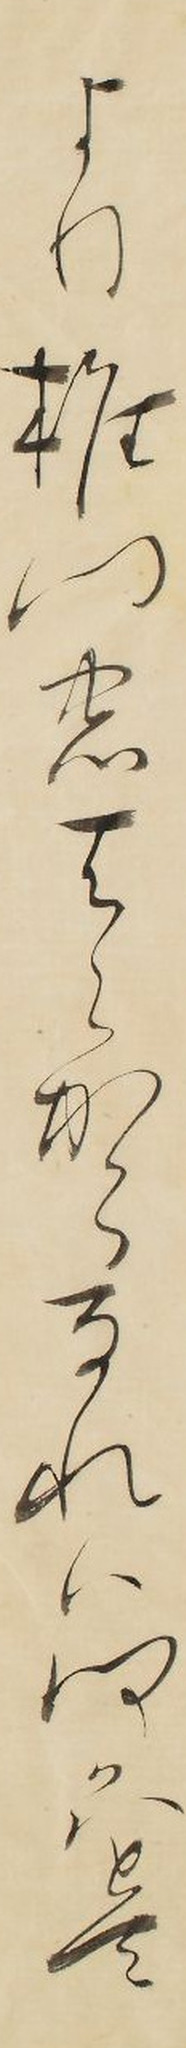より椎門のはらからなれは何かはとて
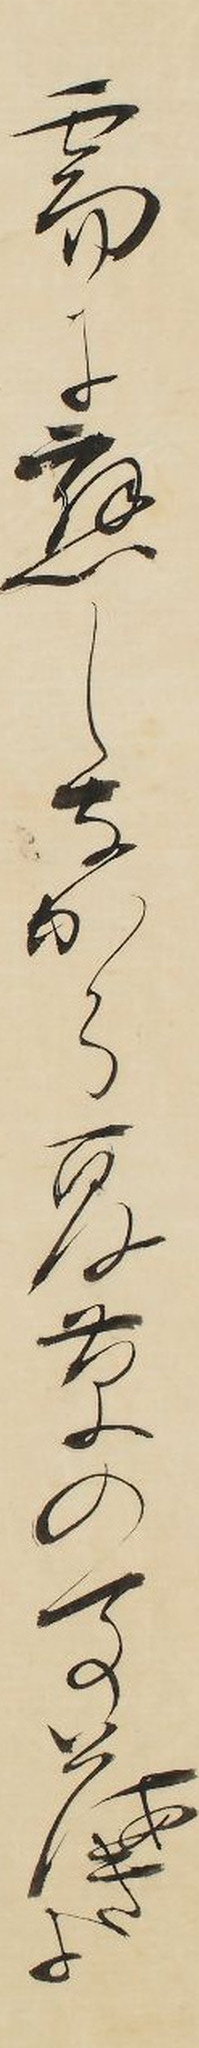需に応しなから夏草の事茂きに
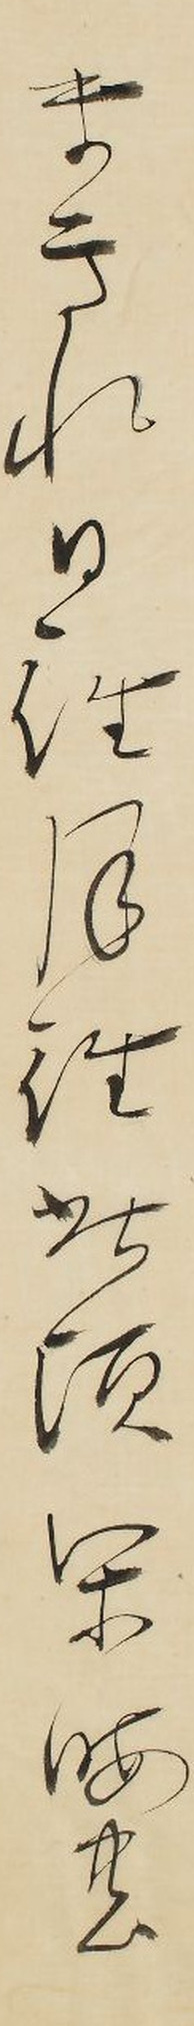まきれ日往月往此頃閑暇の
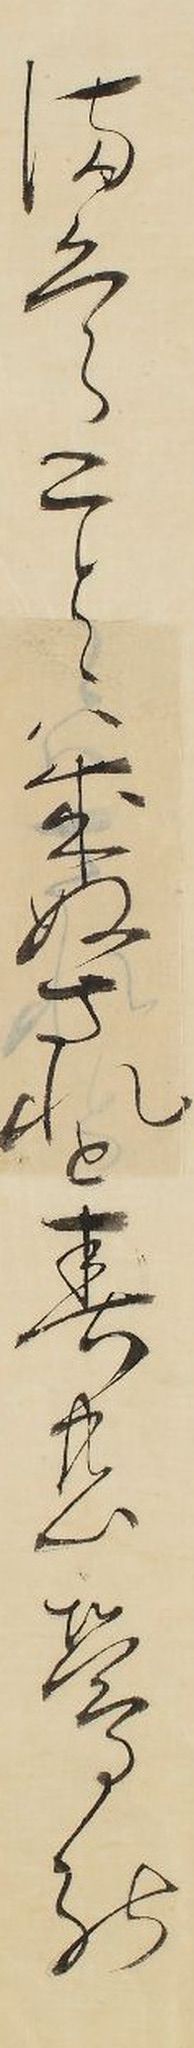まくらことゝは成ぬされと春の鶯の
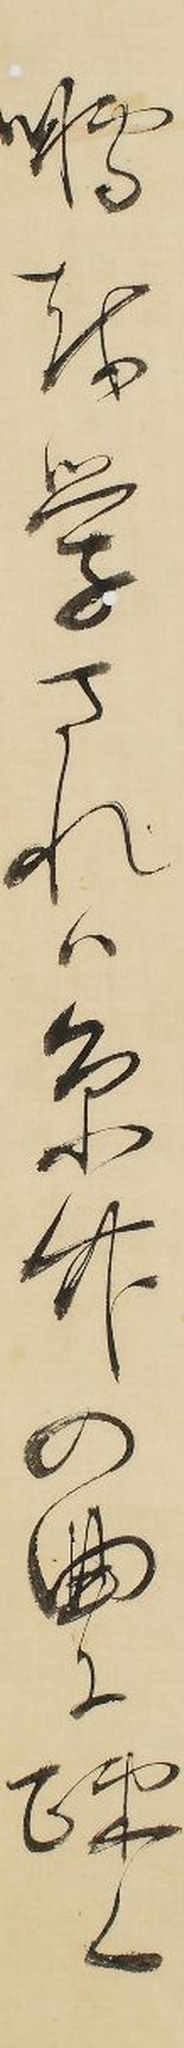囀を学されは糸竹の曲に疎く
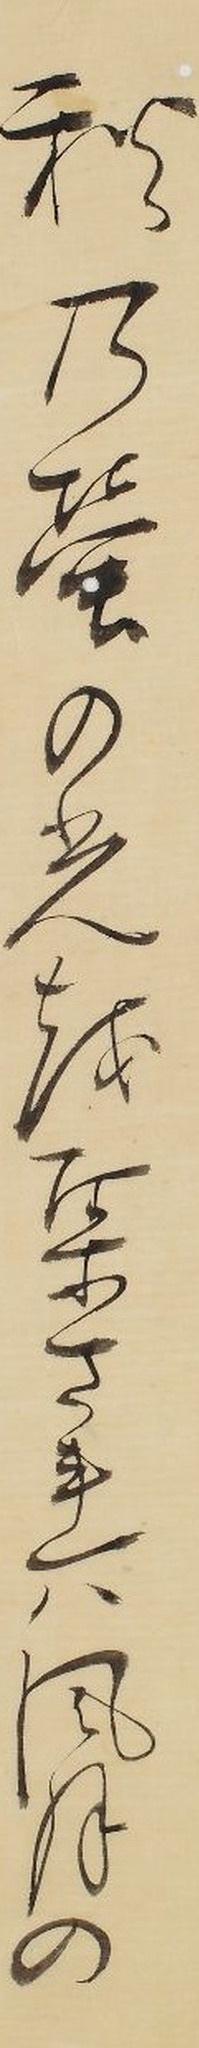秋の蛍の光を集されは風月の
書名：花土産
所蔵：徳島県立図書館
